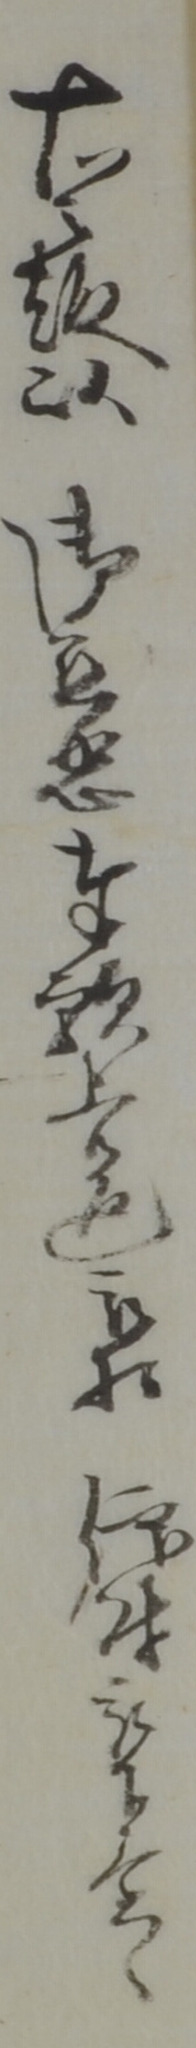右之趣以御慈悲奉願上候通被相仰付被下置候
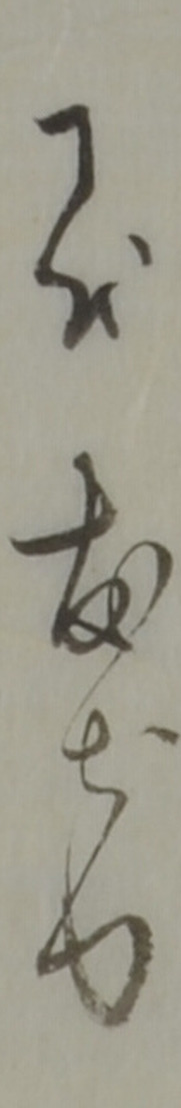丁代友右衛門
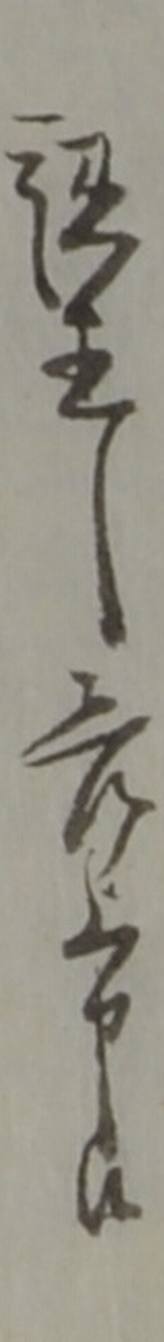認直し差上申候
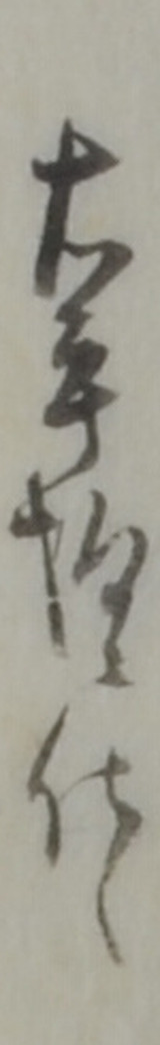右平均ニ仕候

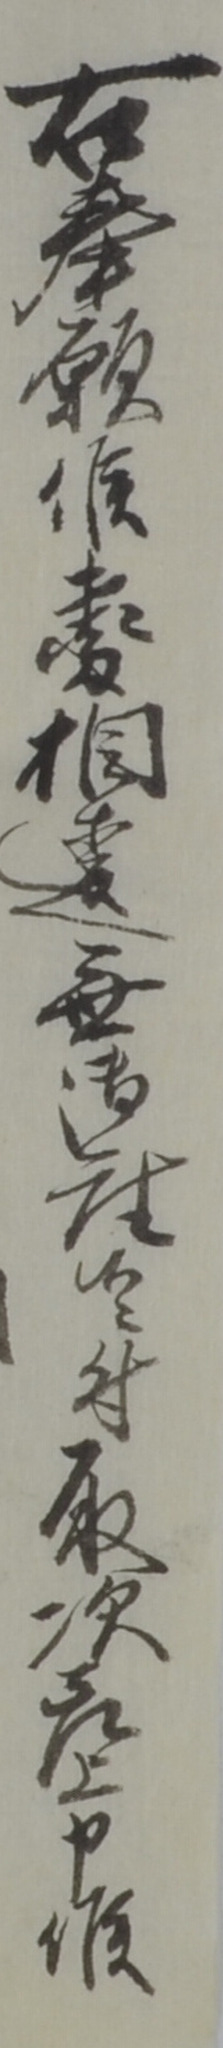右奉願候處相違無御座候ニ付取次差上申候
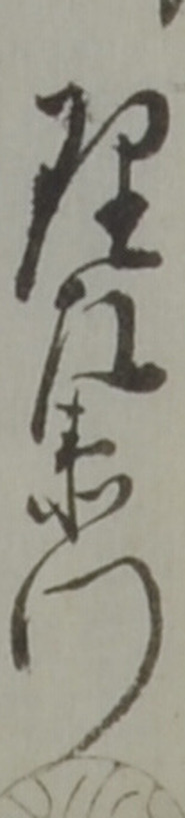同断理左衛門

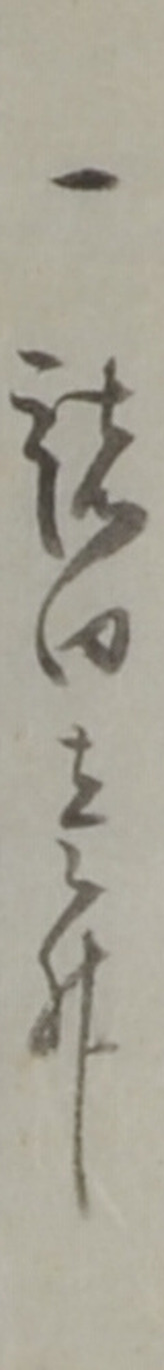一諸白壱升
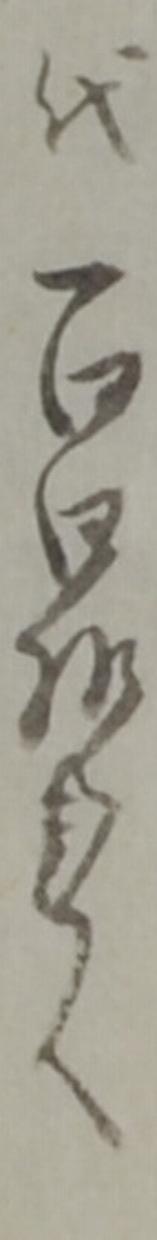代百四拾弐文
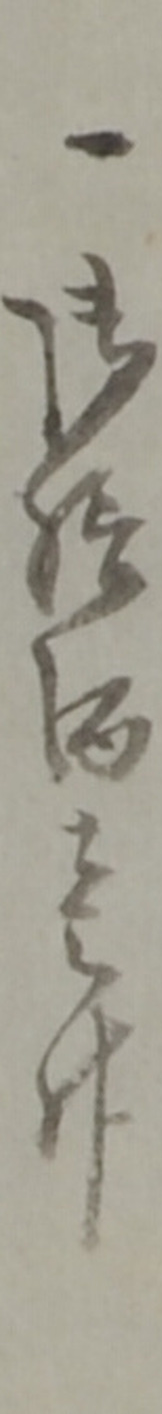一御清酒壱升
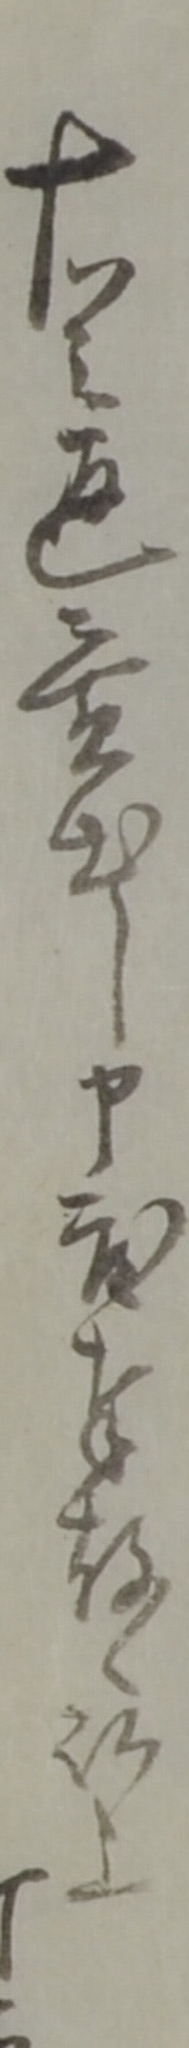右之通売出し申度奉存候以上
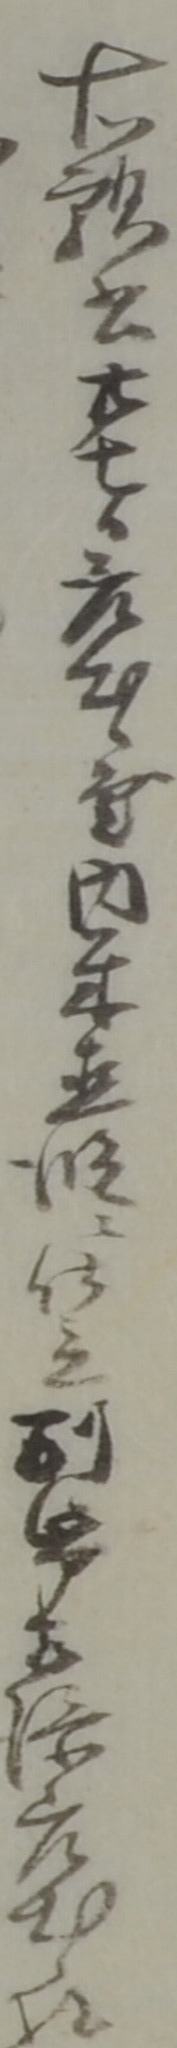右願書廿七日差出候處内米直段ニ仕立別紙相添差出候様
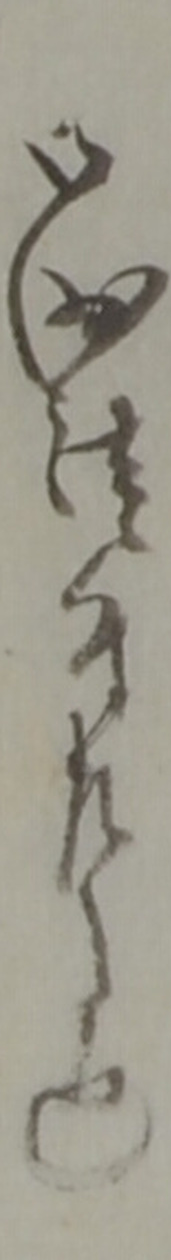御沙汰ニ付左之通
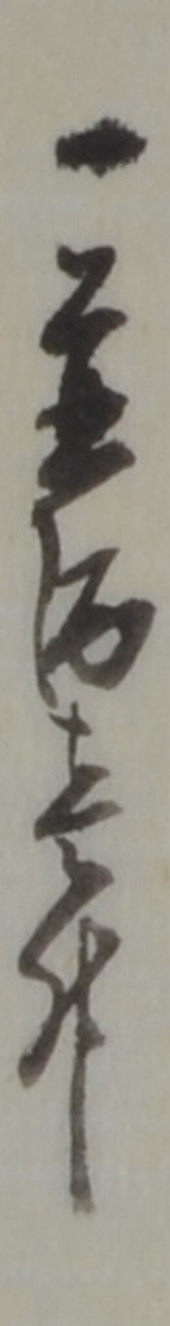一清酒壱升
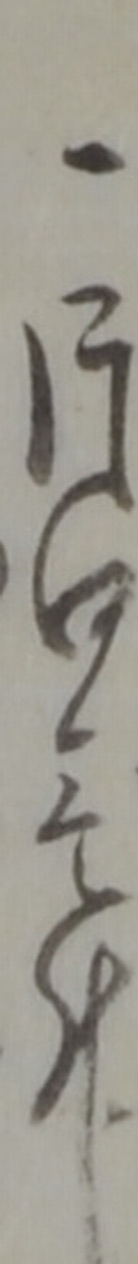一諸白壱升
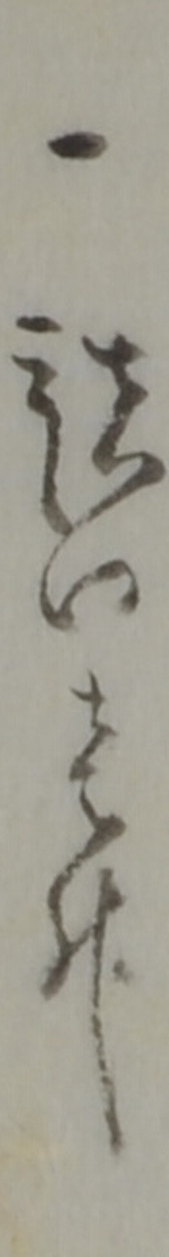一諸白壱升
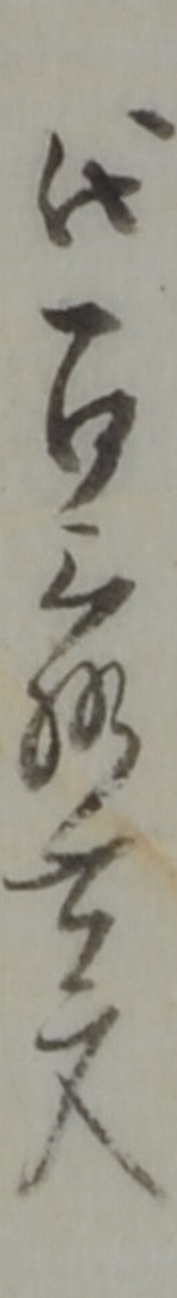代百三拾六文
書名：諸願書控簿
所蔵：伊那市立高遠町図書館・合同会社AMANE
